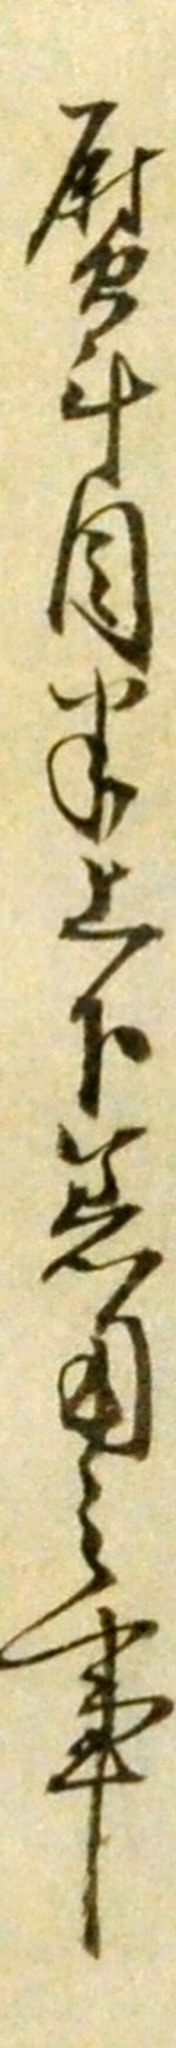熨斗目半上下着用之事

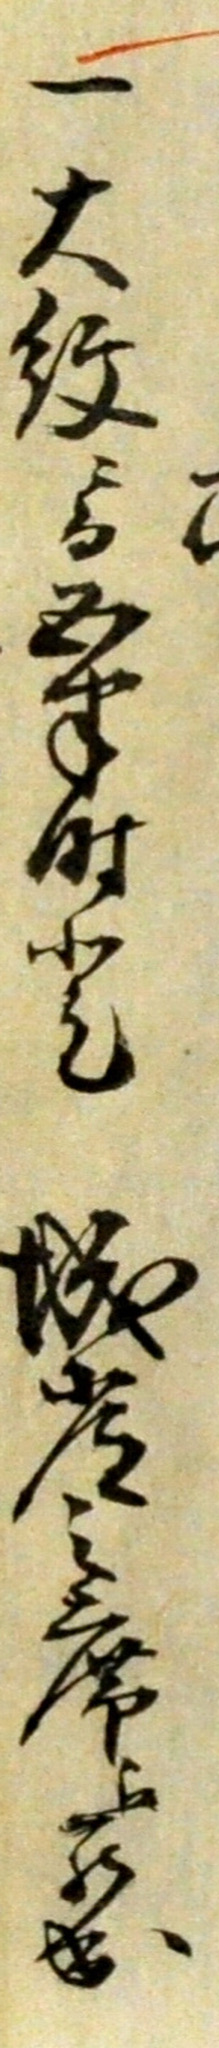一大紋にて五半時登城常之席え罷出
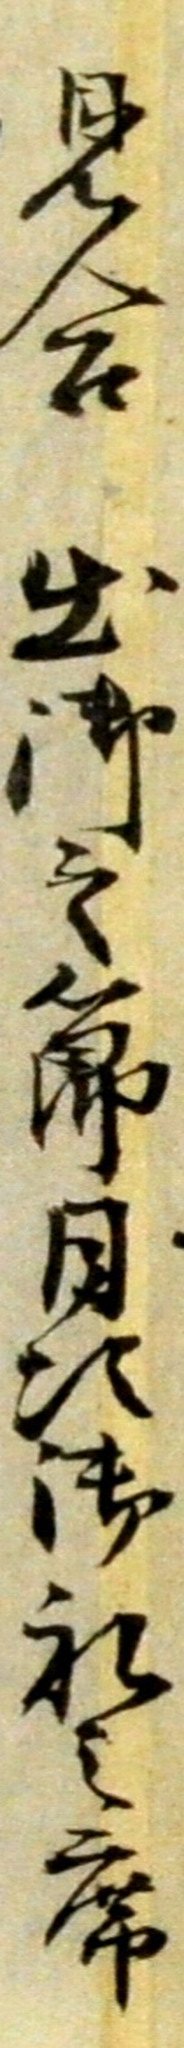見合出御之節月次御礼之席
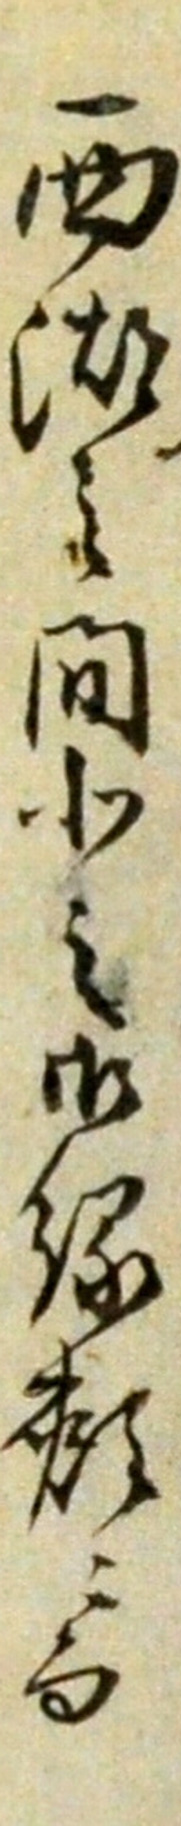西湖之間北之御縁頬にて
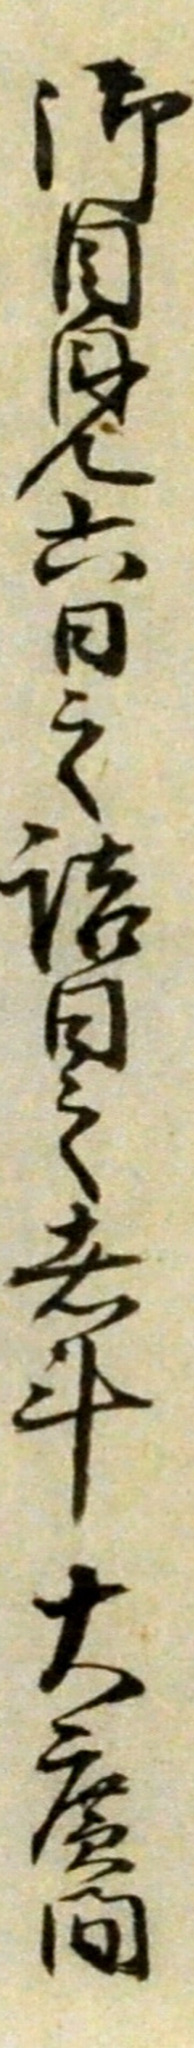御目見六日之詰日之者斗大広間
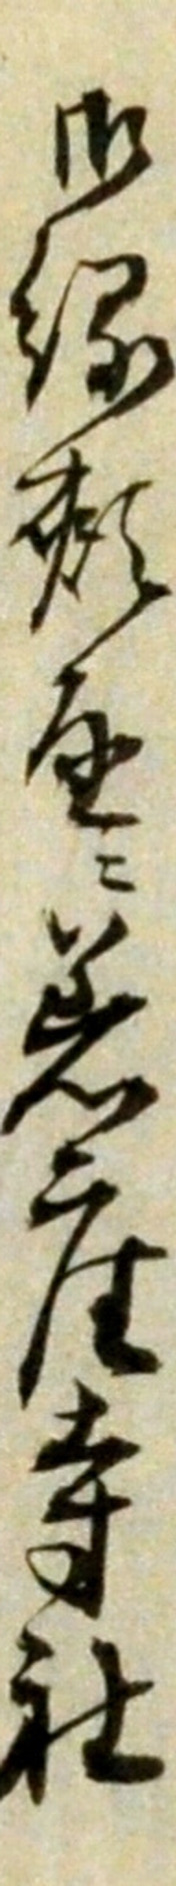御縁頬通に着座寺社
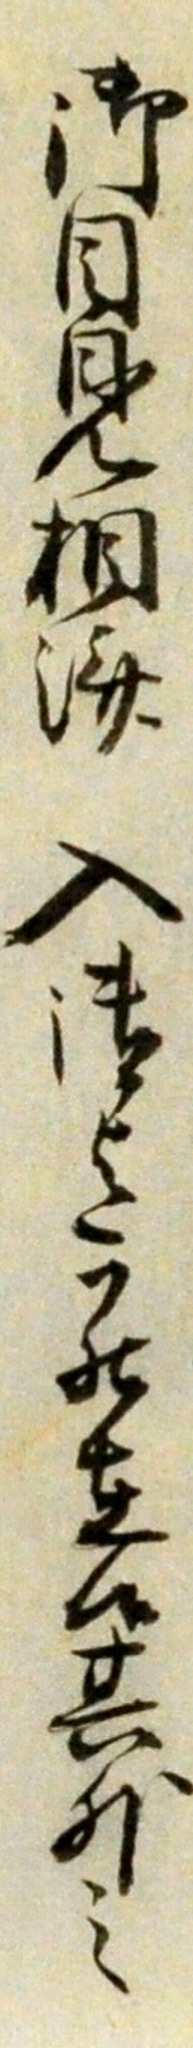御目見相済入御迄罷在候其外之
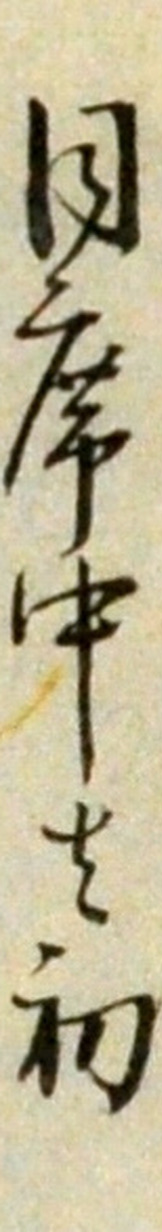同席中は初
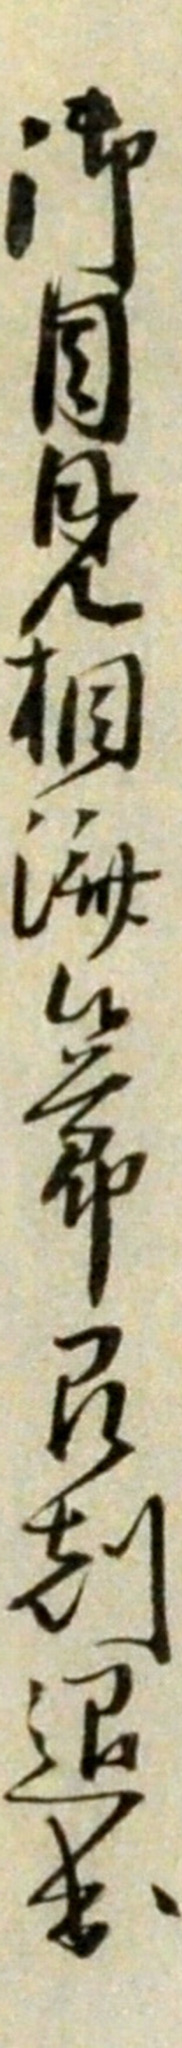御目見相済候節即刻退出
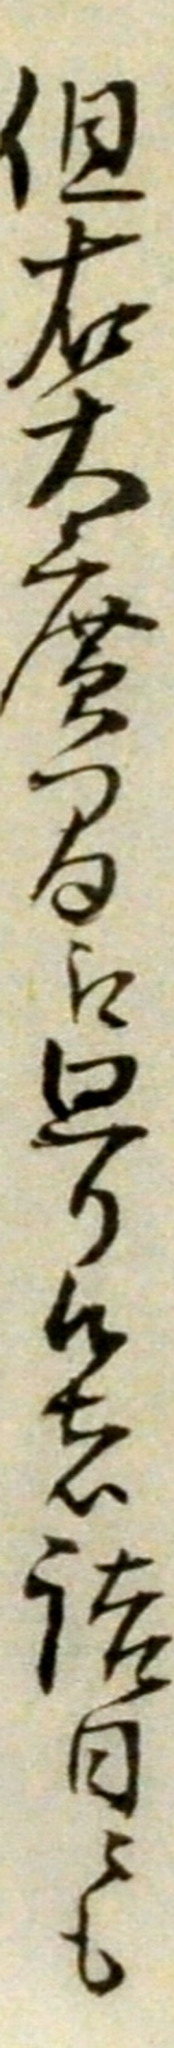但右大広間え廻り候者詰日にも
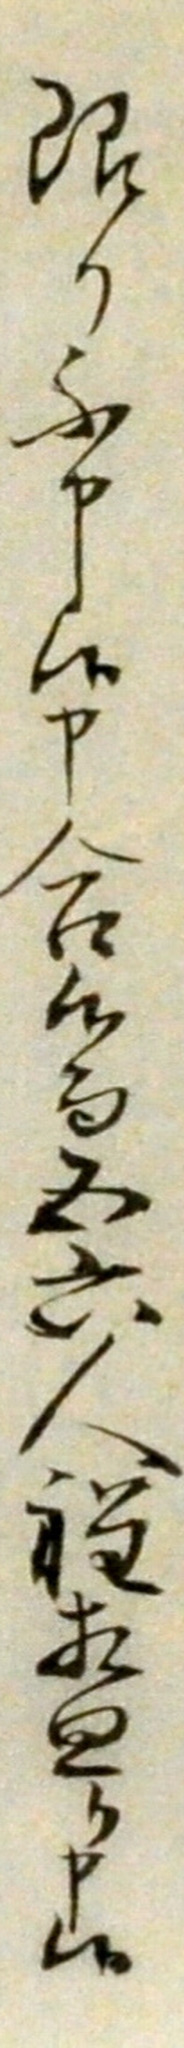限り不申候申合候て五六人程相廻り申候
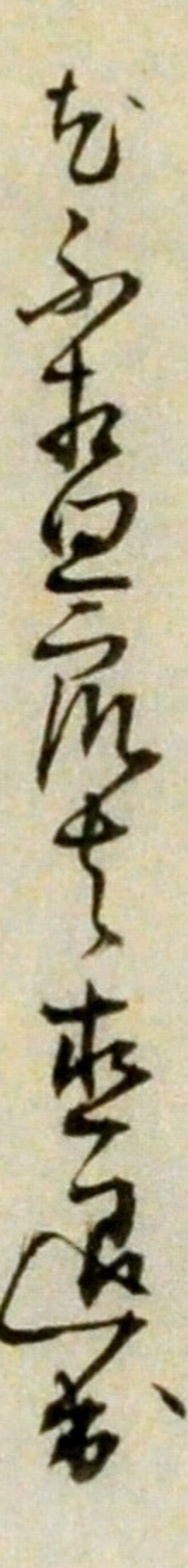尤不相廻衆は直退出
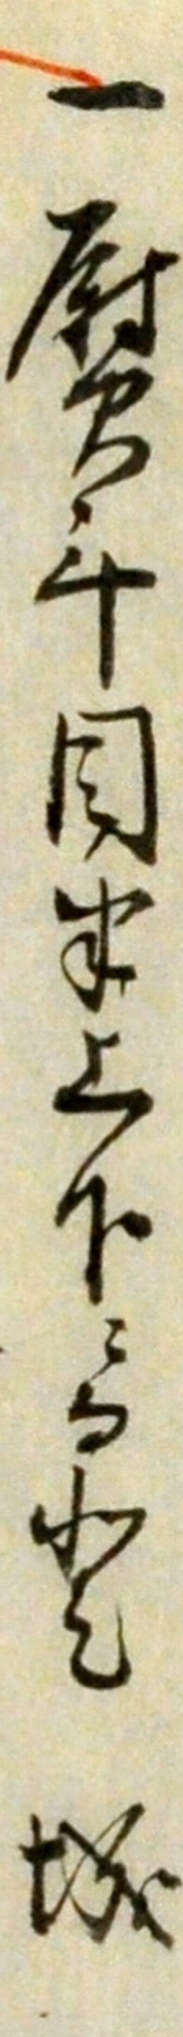一熨斗目半上下にて登城
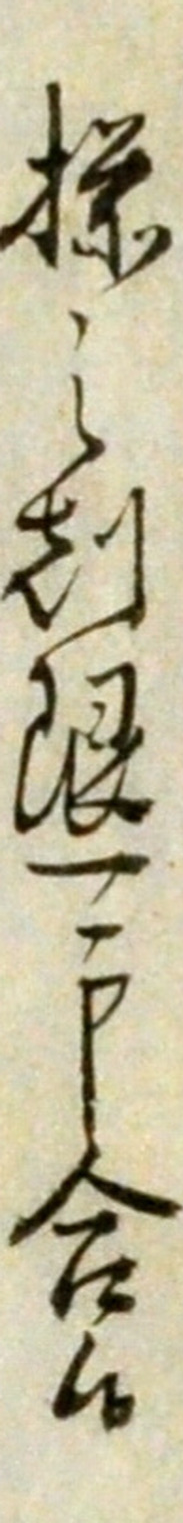揃之刻限可申合候
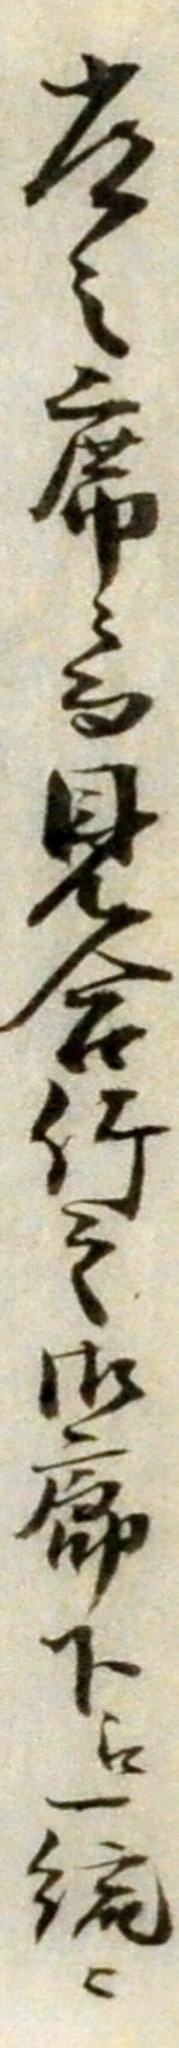常之席にて見合竹之御廊下え一統に
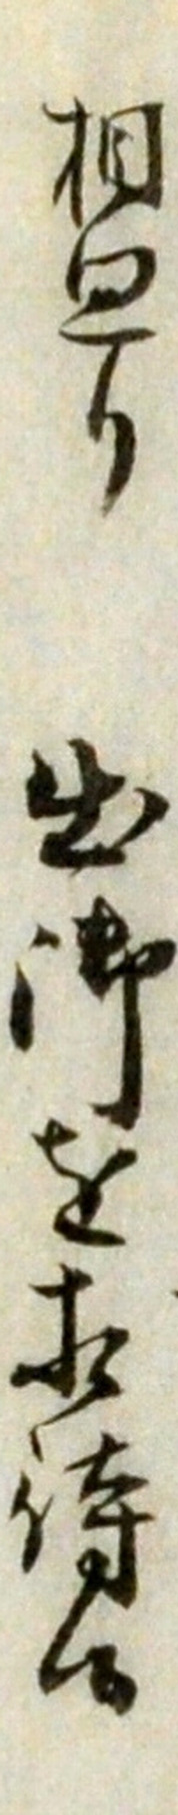相廻り出御を相待候
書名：申合帳〔一括〕
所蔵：伊那市立高遠町図書館・合同会社AMANE
